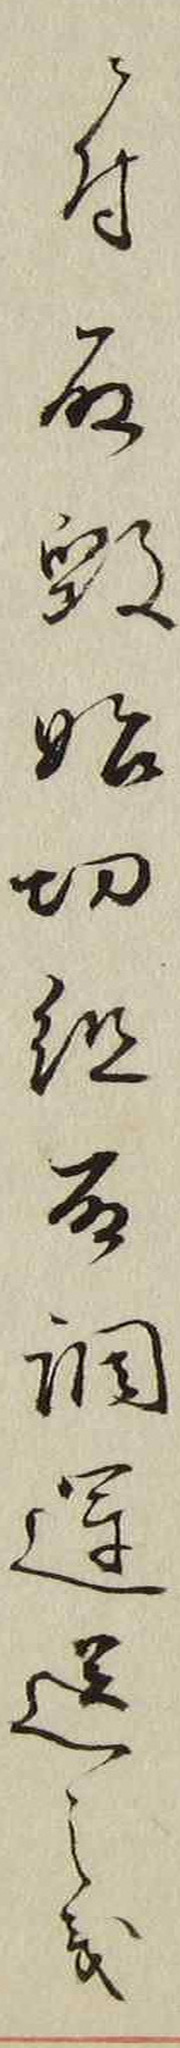ニ付取毀始切組取調運送之義
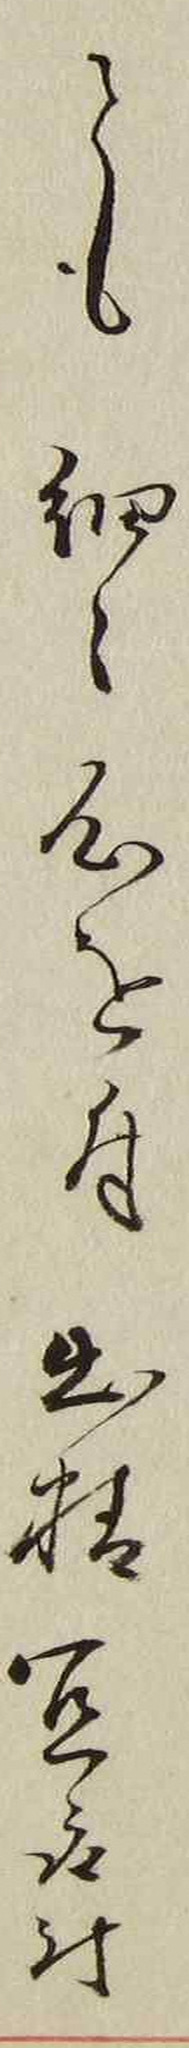とも細々心を付出精宜取計
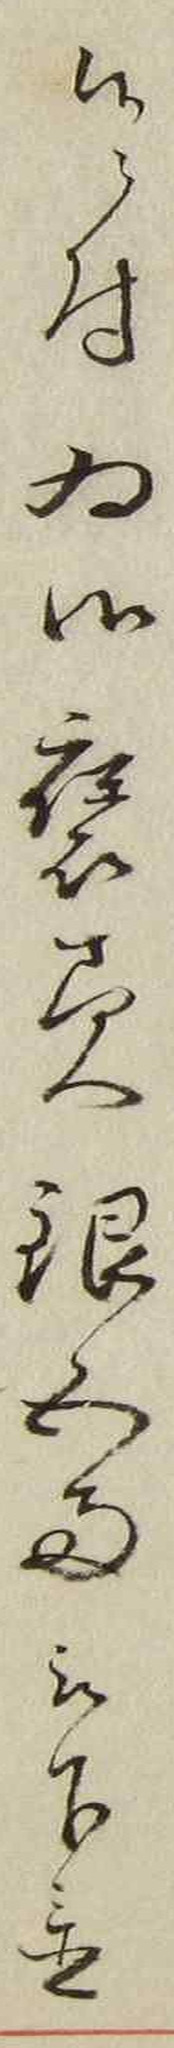候ニ付為御褒美銀五両被下置

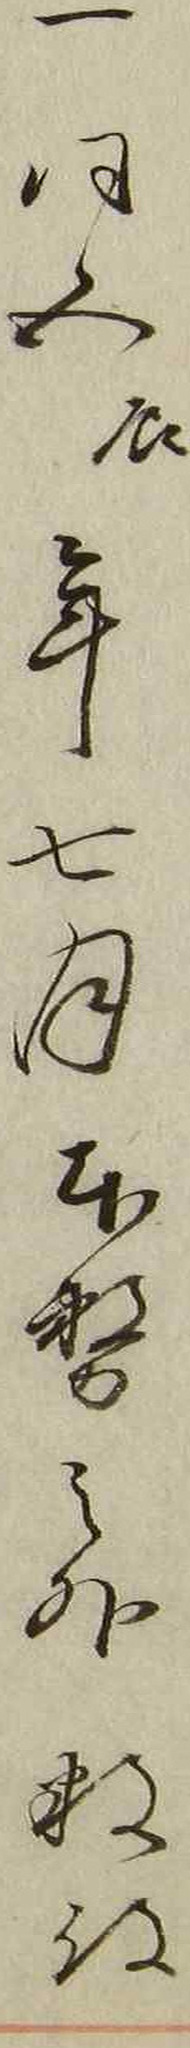一同五辰年七月本務之外数役
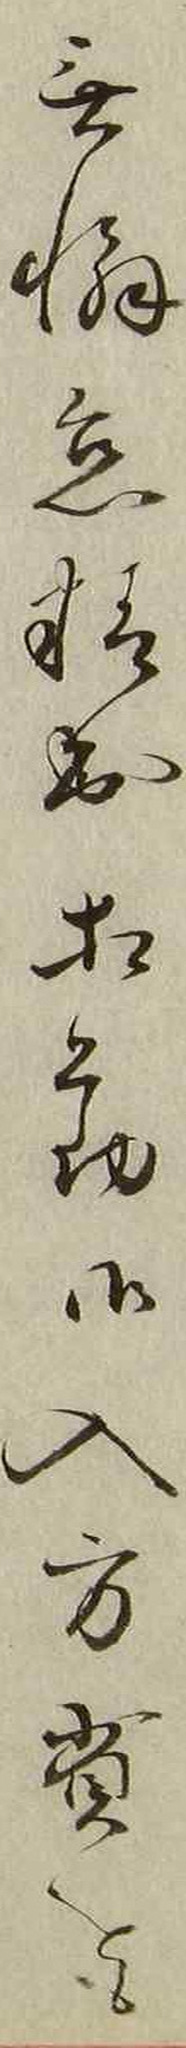無懈怠精出相勤御入方省をも
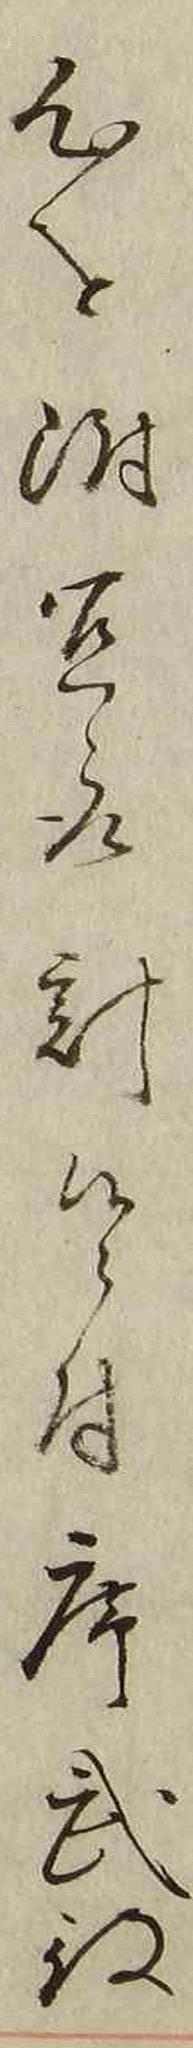心を附宜取計候ニ付席武役
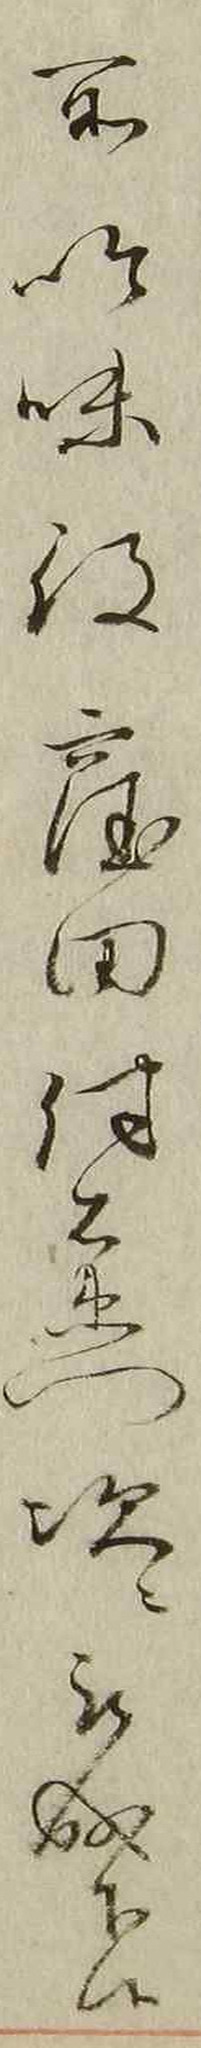所吟味役窪田伴右衛門次ニ被成下候
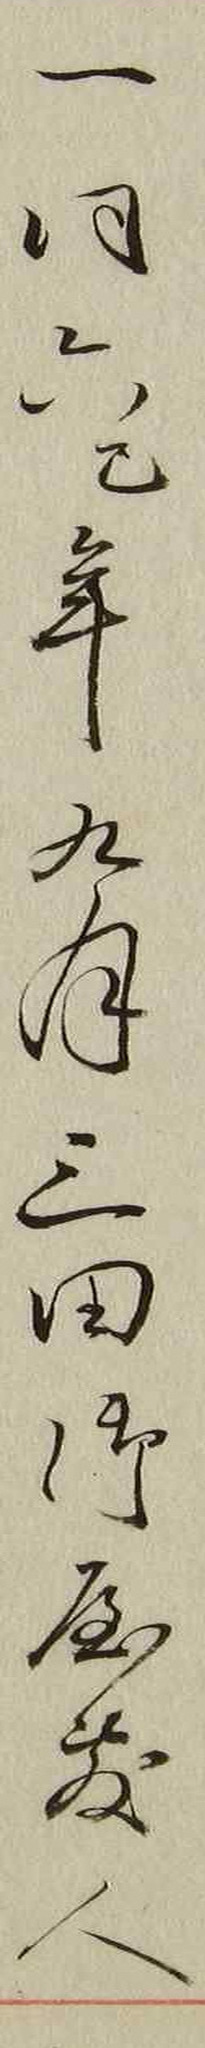一同六巳年九月三田御屋敷人
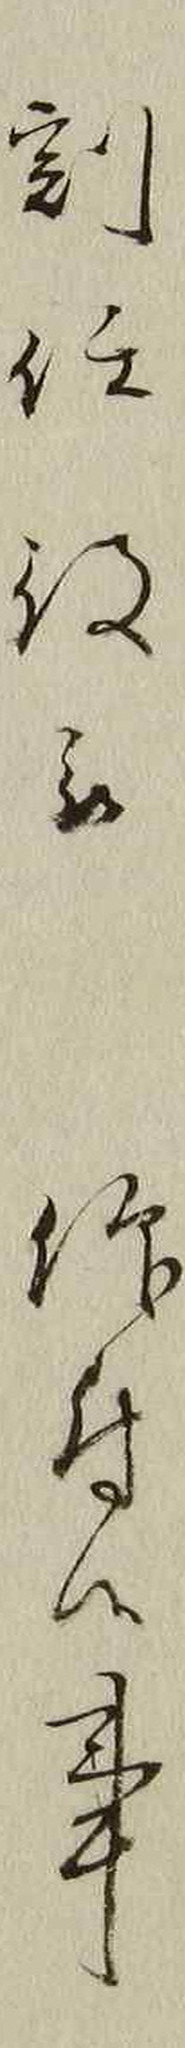割任役被仰付候事
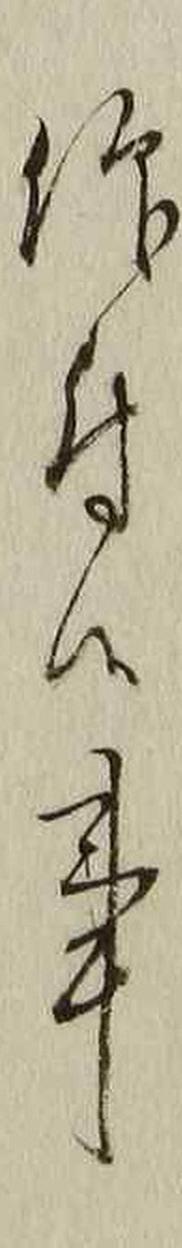仰付候事
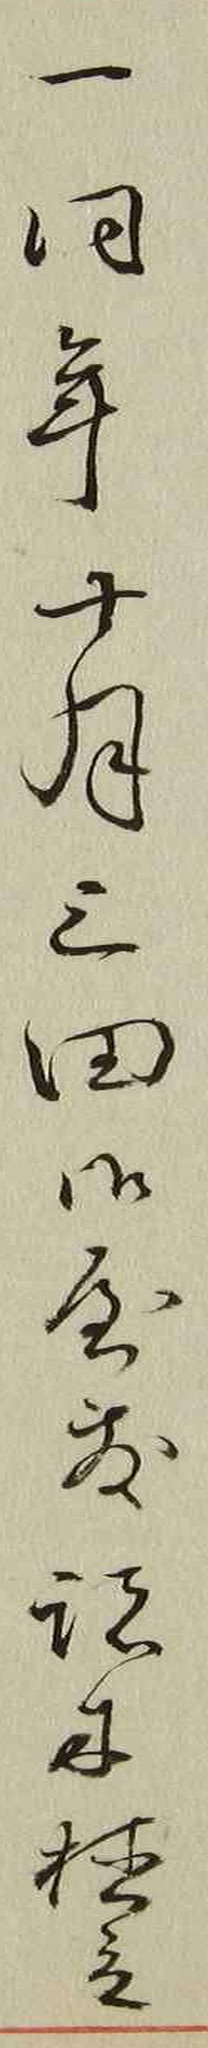一同年十月三田御屋敷諸木植立
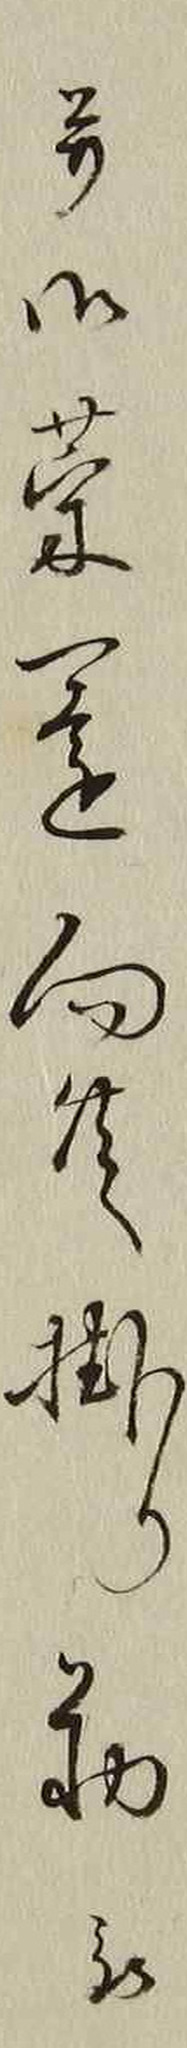并御菜園向共掛り勤被
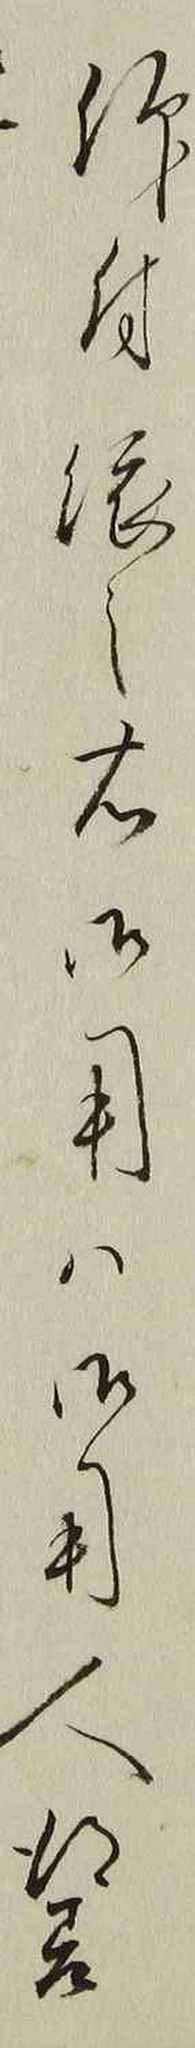仰付依之右御用ハ御用人得差
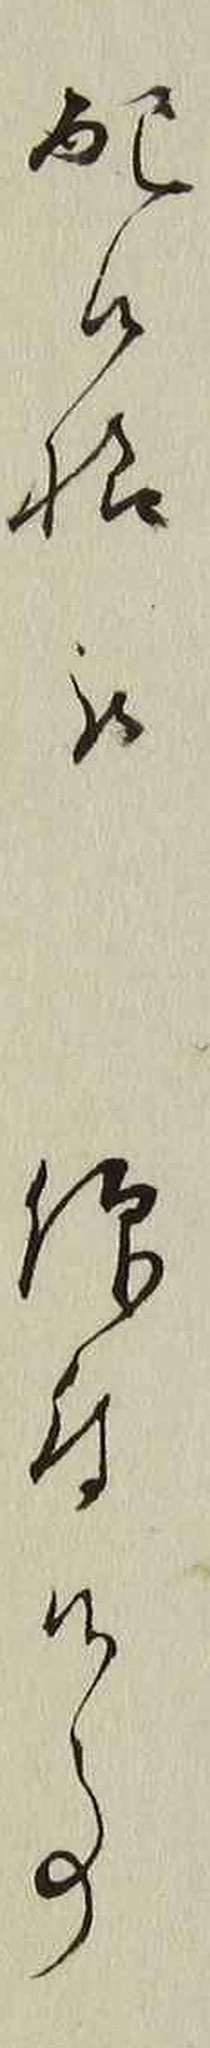配候様被仰付候事
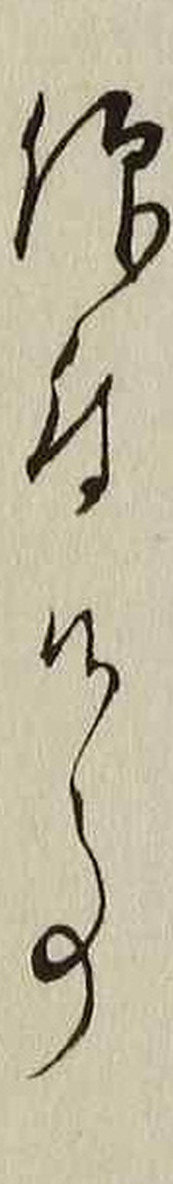仰付候事
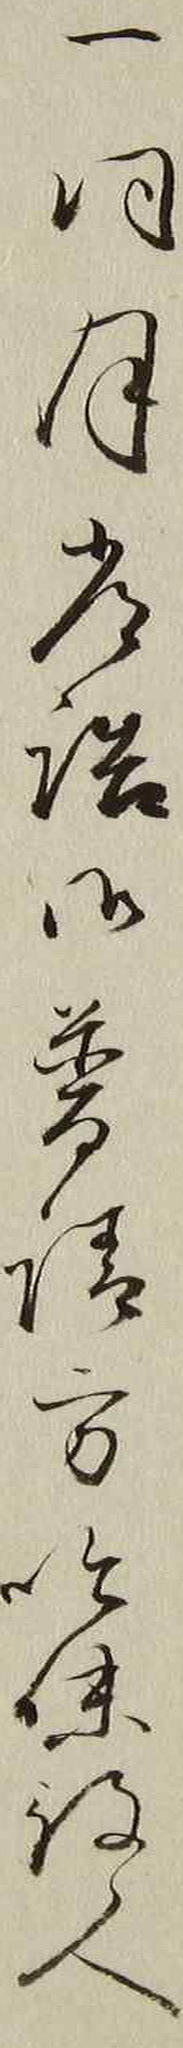一同月常詰御普請方吟味役人
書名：諸士系譜　巻之8　い之部8
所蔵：会津若松市立会津図書館
